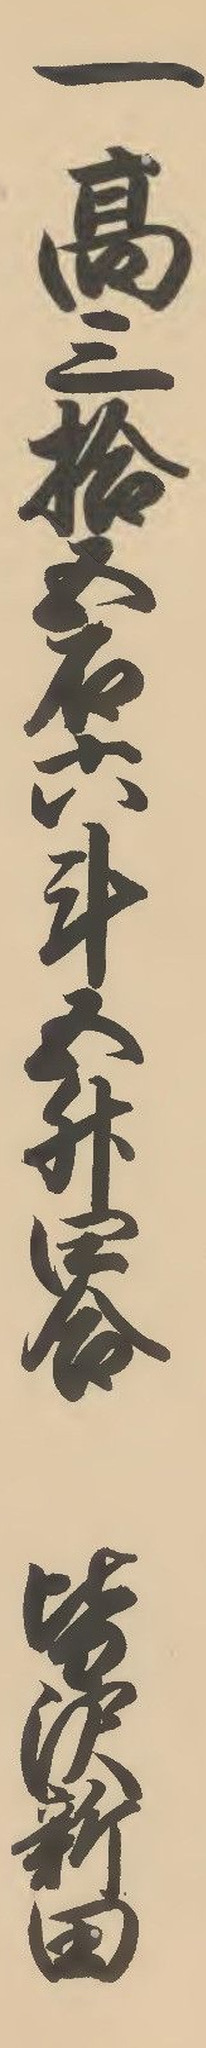一髙三拾五石六斗五升四合皆沢新田
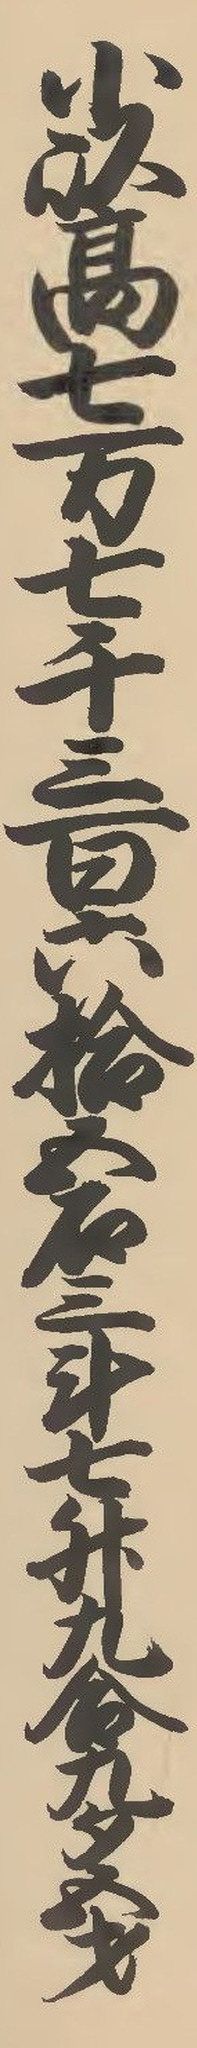小以髙七万七千三百六拾五石三斗七升九合九夕五才

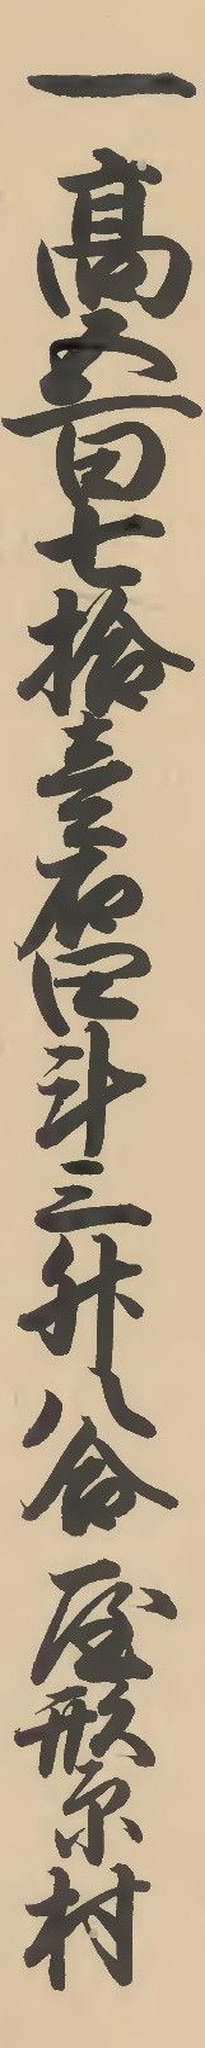一髙五百七拾壱石四斗三升八合屋形原村
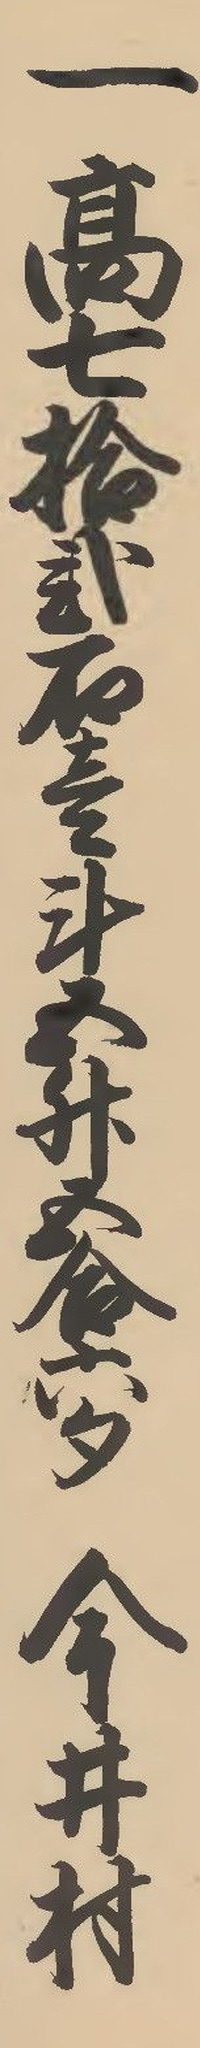一髙七拾弐石壱斗五升五合六夕今井村
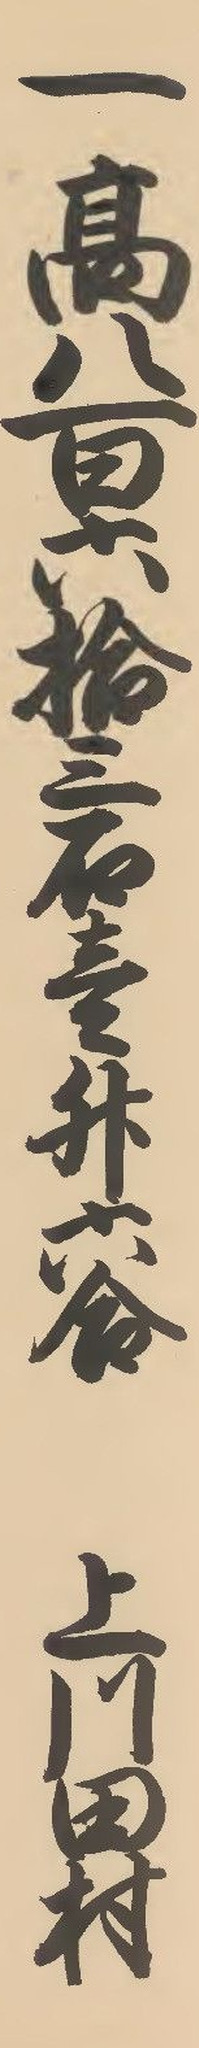一髙八百六拾三石壱升六合上川田村
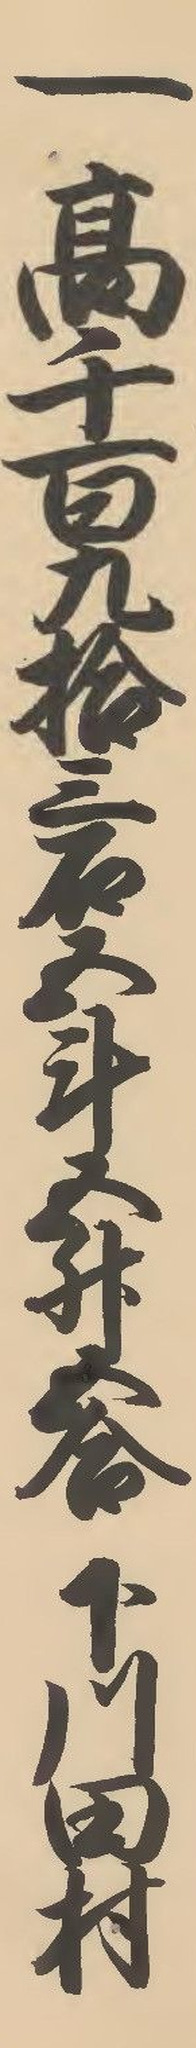一髙千百九拾三石五斗五升五合下川田村
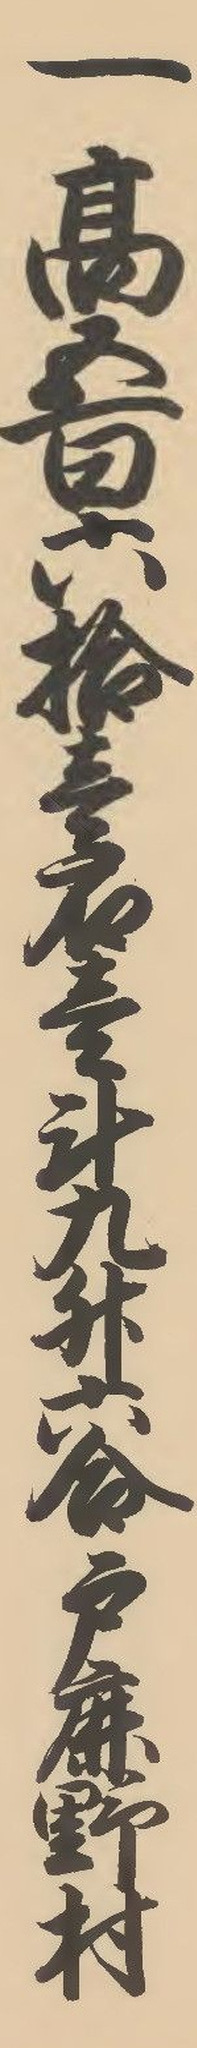一髙五百六拾壱石壱斗九升六合戸鹿野村
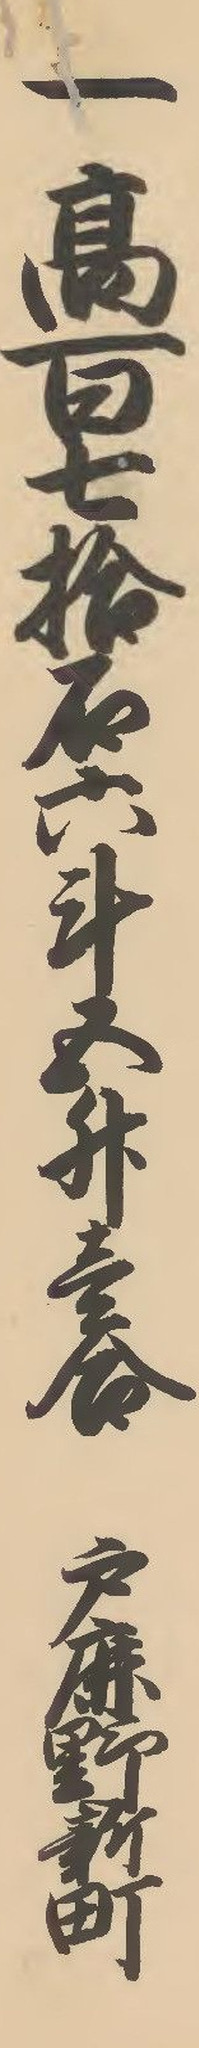一髙百七拾石六斗五升壱合戸鹿野新町

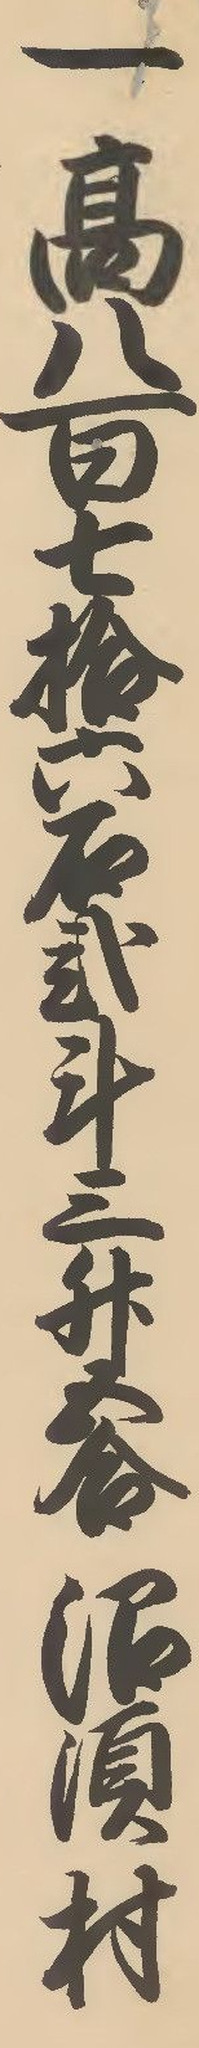一髙八百七拾六石弐斗三升五合沼須村
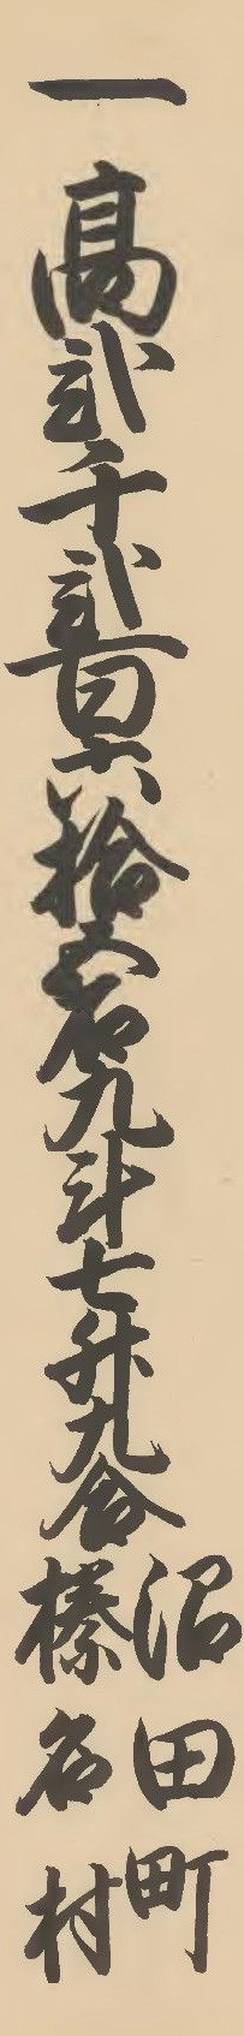一髙弐千弐百六拾五石九斗七升九合
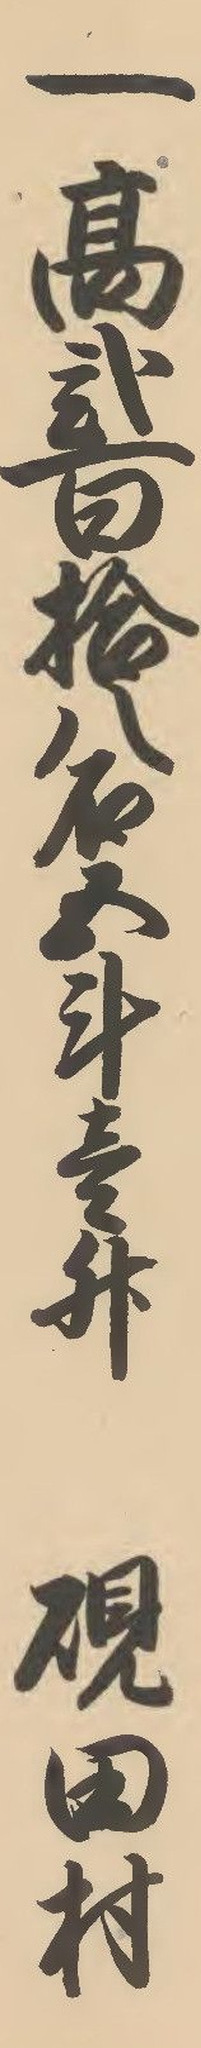一髙弐百拾八石五斗壱升硯田村
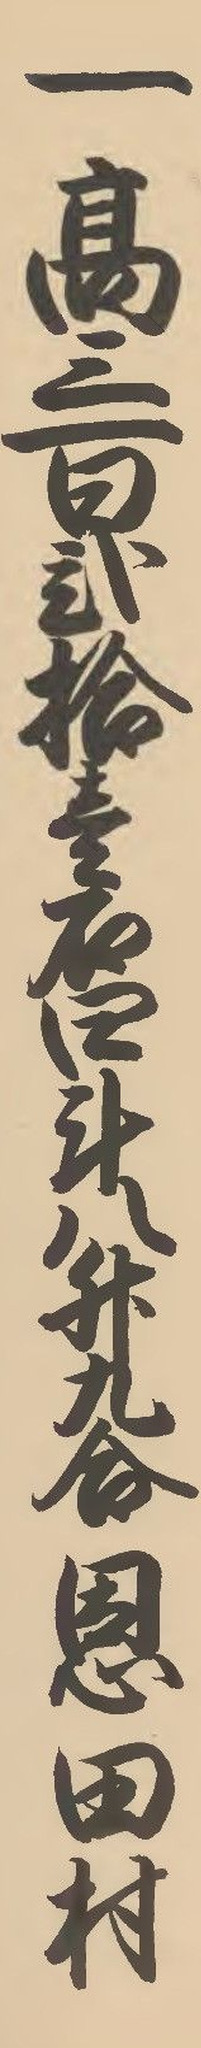一髙三百弐拾壱石四斗八升九合恩田村
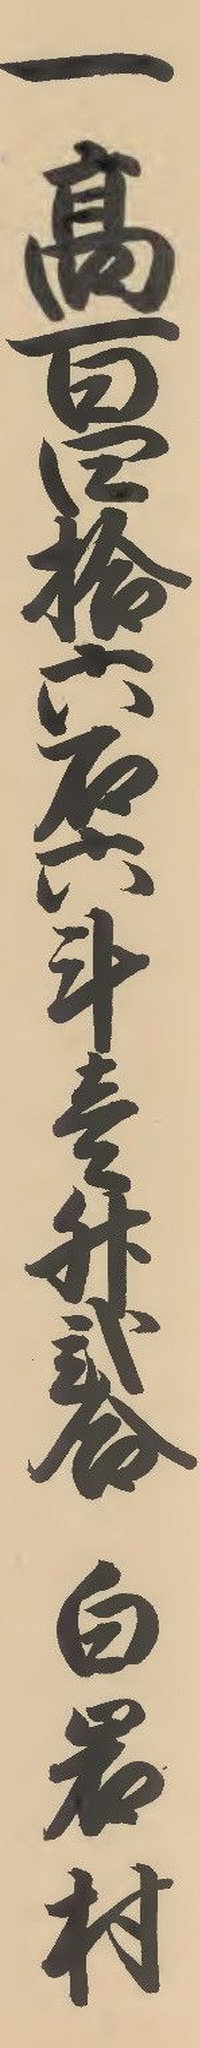一髙百四拾六石六斗壱升弐合白岩村
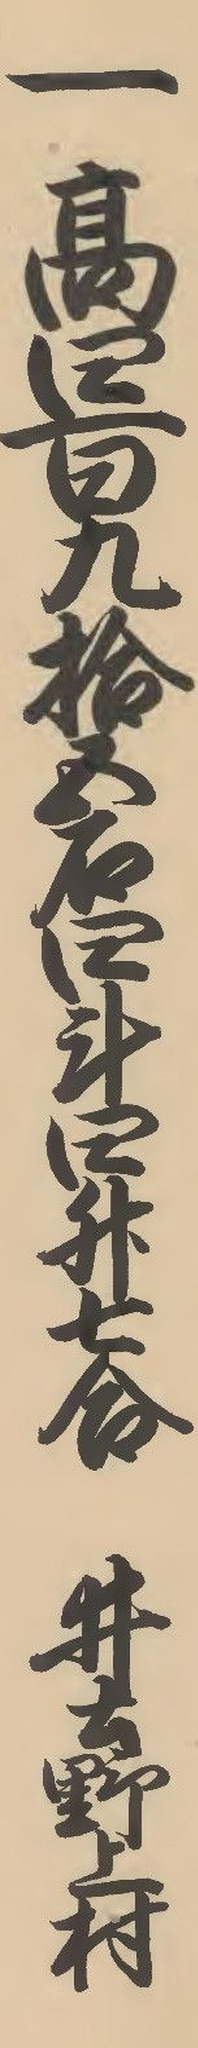一髙四百九拾五石四斗四升七合井土野上村
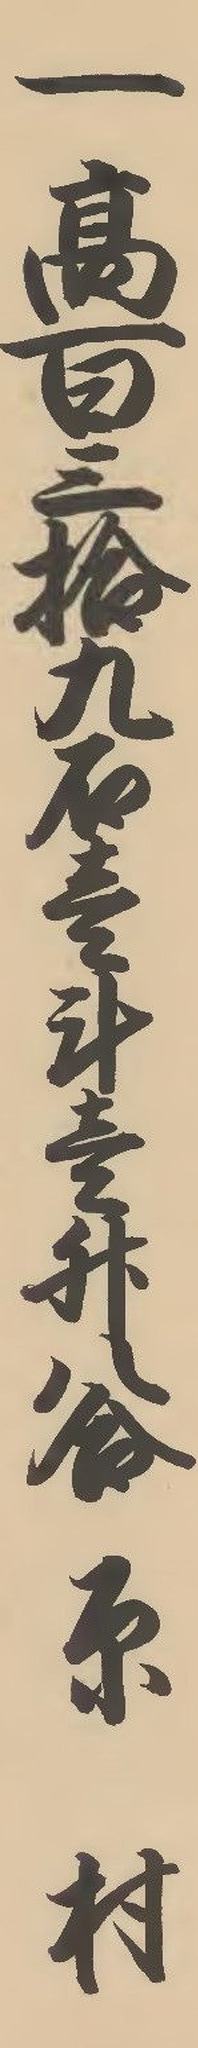一髙三拾九石壱斗壱升八合原村
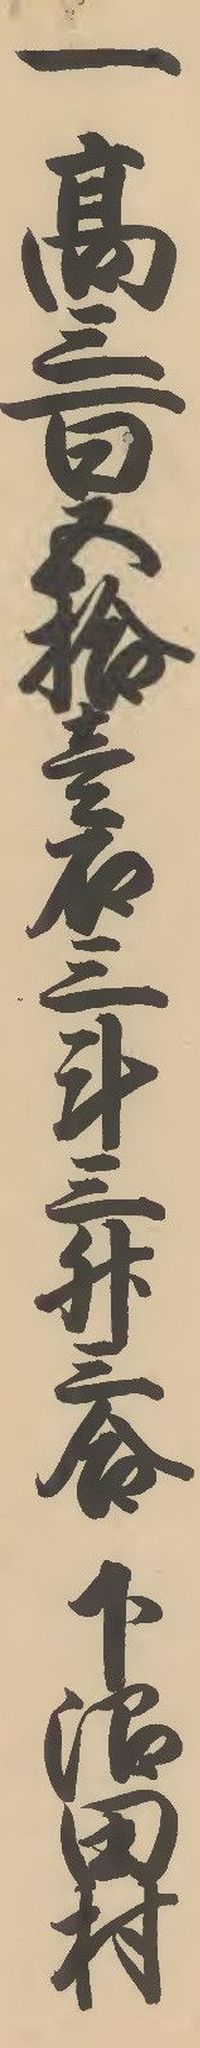一髙三百五拾壱石三斗三升三合下沼田村
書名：上野国郷帳
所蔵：国立公文書館 National Archives of Japan
